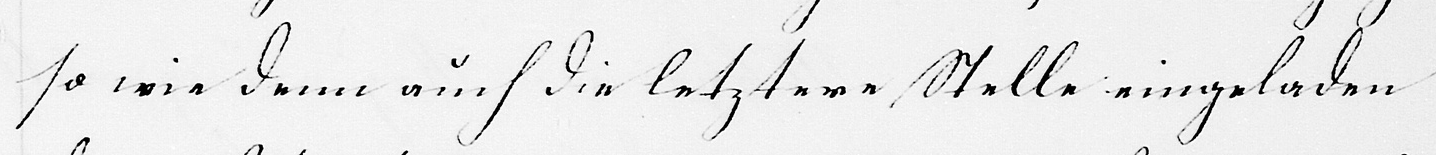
so wie denn auch die letztere Stelle eingeladen
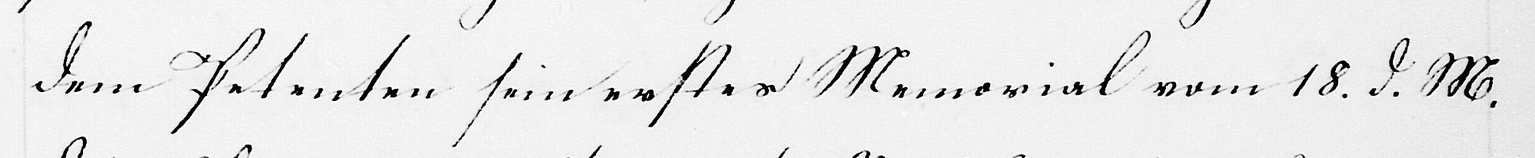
dem Petenten sein erstes Memorial vom 18. d. M.
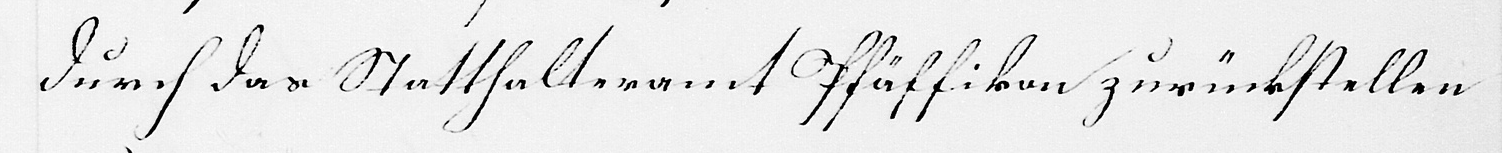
durch das Statthalteramt Pfäffikon zurückstellen
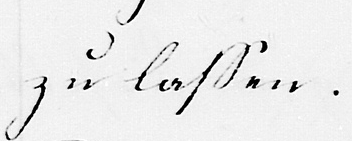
zu laßen.
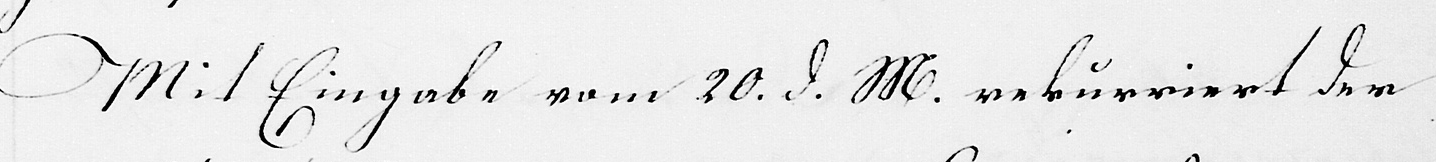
Mit Eingabe vom 20. d. M. rekurriert der
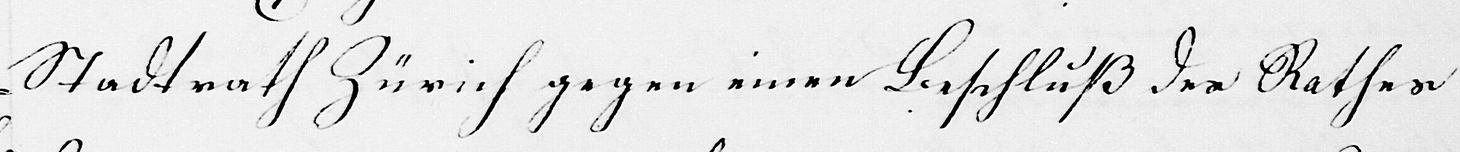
Stadtrath Zürich gegen einen Beschluß des Rathes
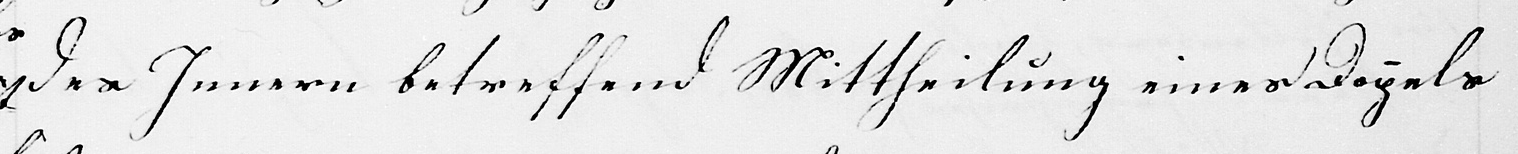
des Innern betreffend Mittheilung eines Doppels
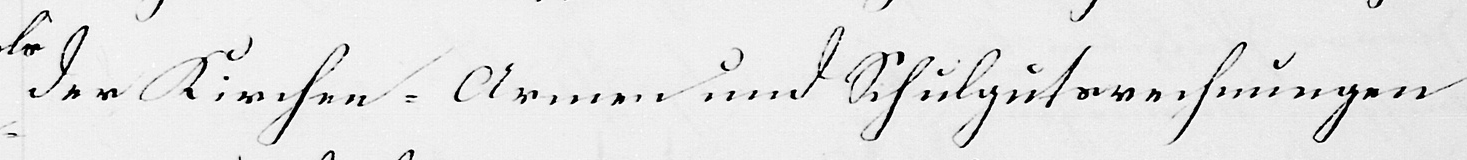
der Kirchen- Armen und Schulgutsrechnungen
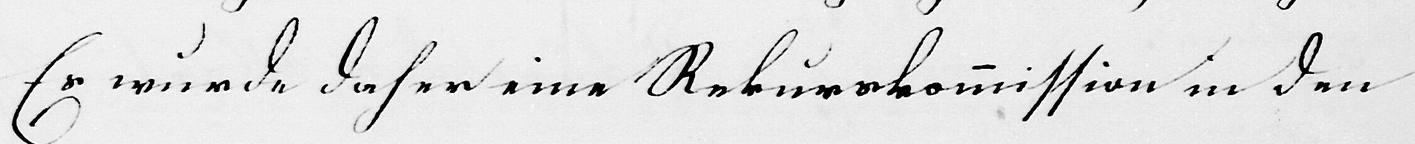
Es wurde daher eine Rekurskommission in den
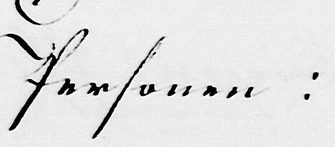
Personen:
